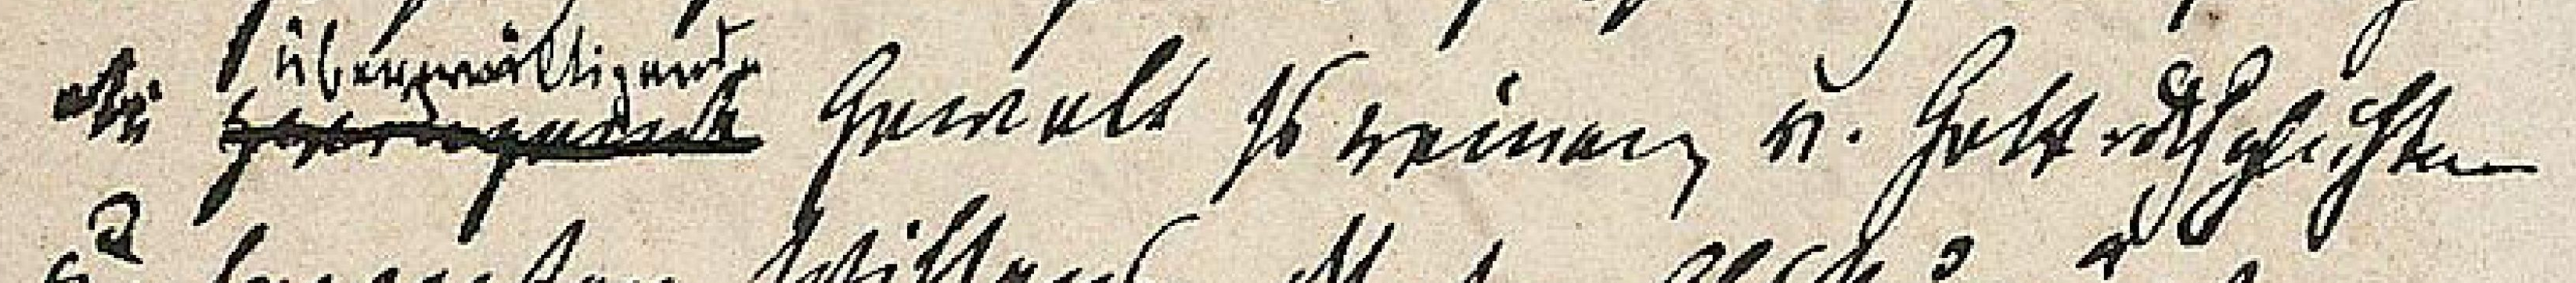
die zernzende Gewalt ss reinen, v. Gott dchglühten
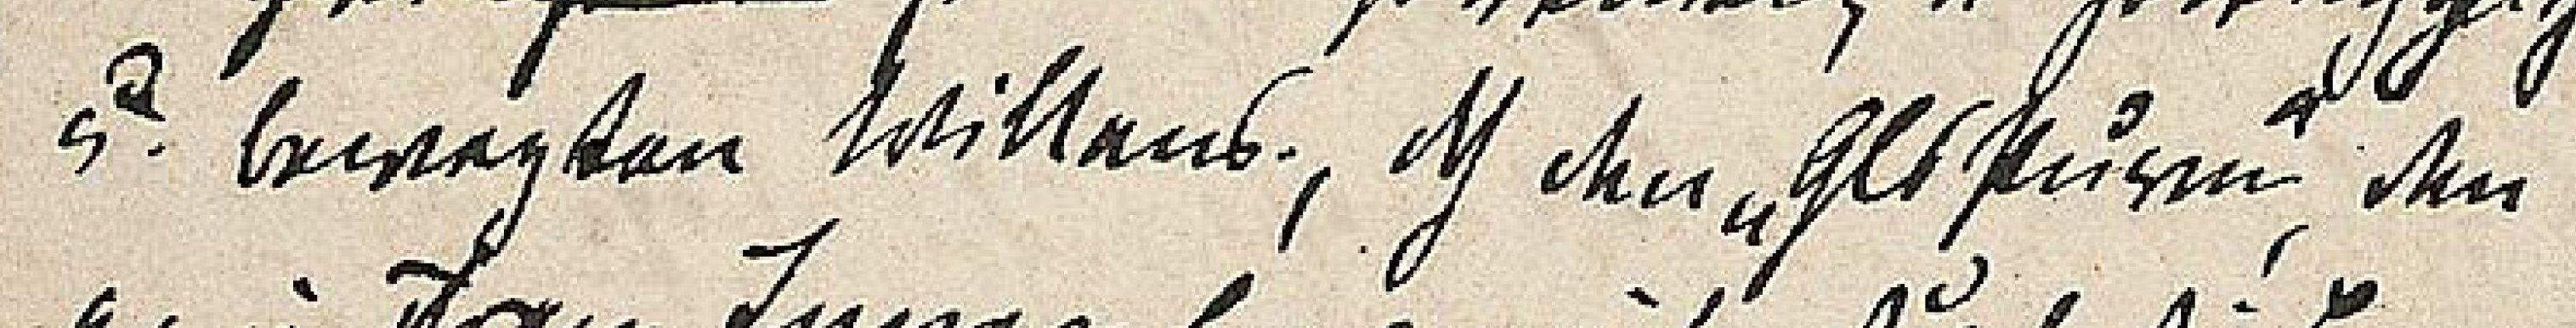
u. bewegten Willens, doch den "Glssturm", den
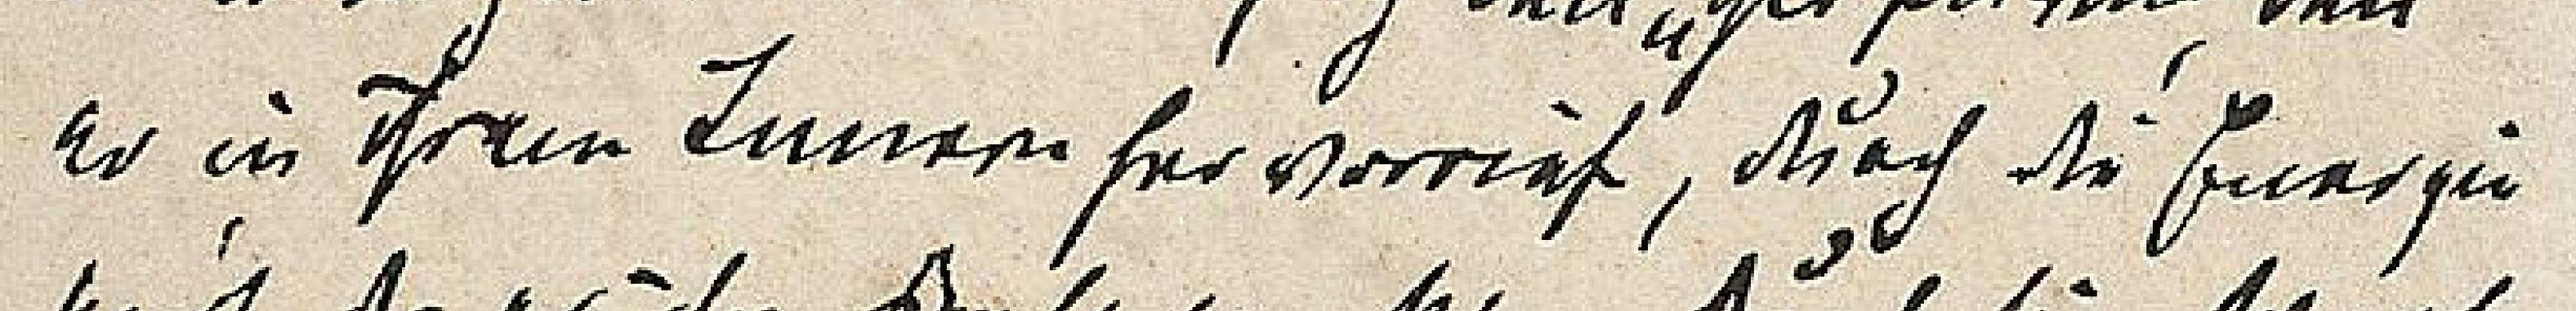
er in ihrem Innern hervorrief, durch die Energie
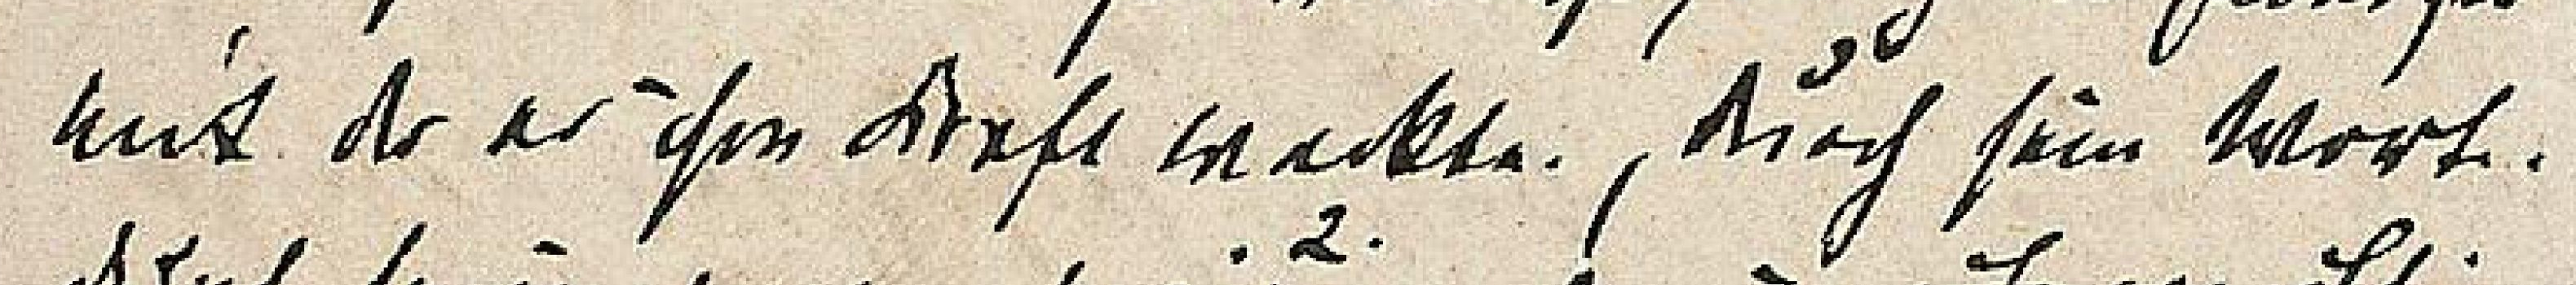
mit der er ihre Kraft weckte, durch sein Wort.
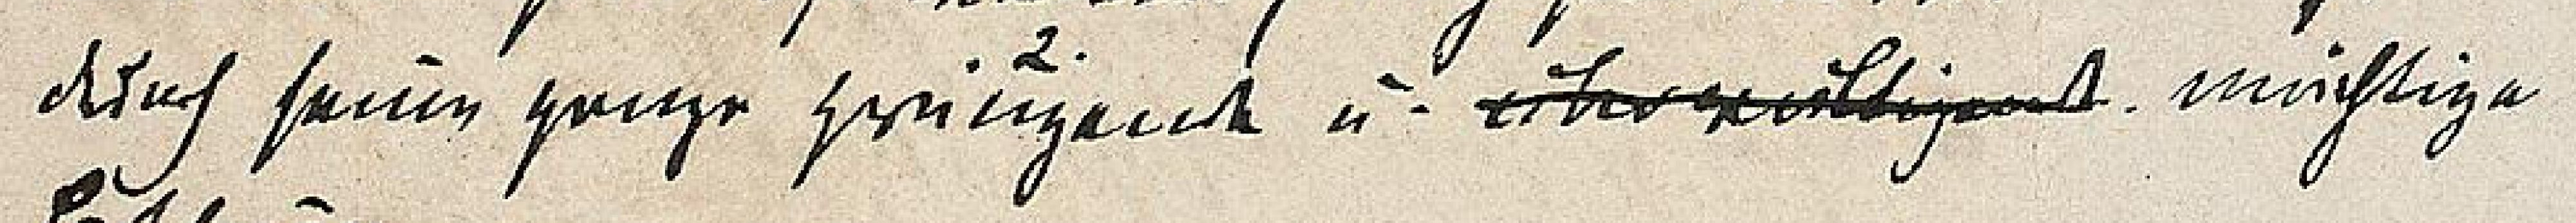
durch seine ganze zwingenden u. überwältigend. mächtige
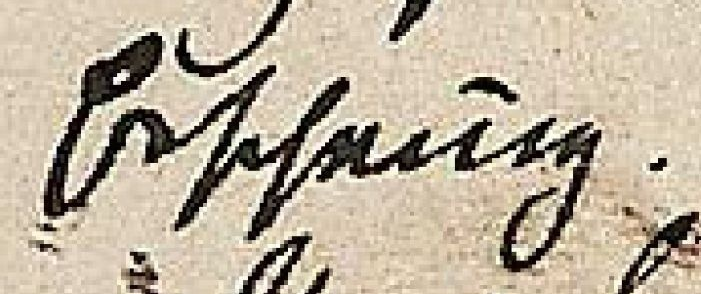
Erscheinung.
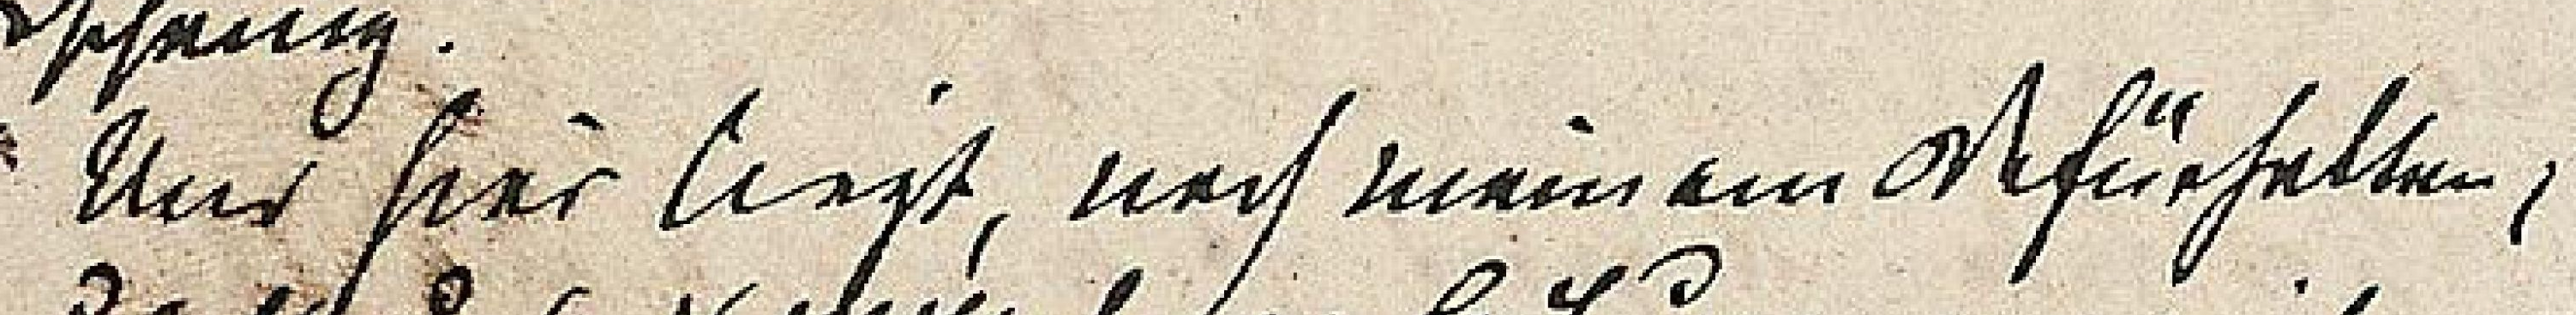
Und hier liegt, nach meinem Dafürhalten,
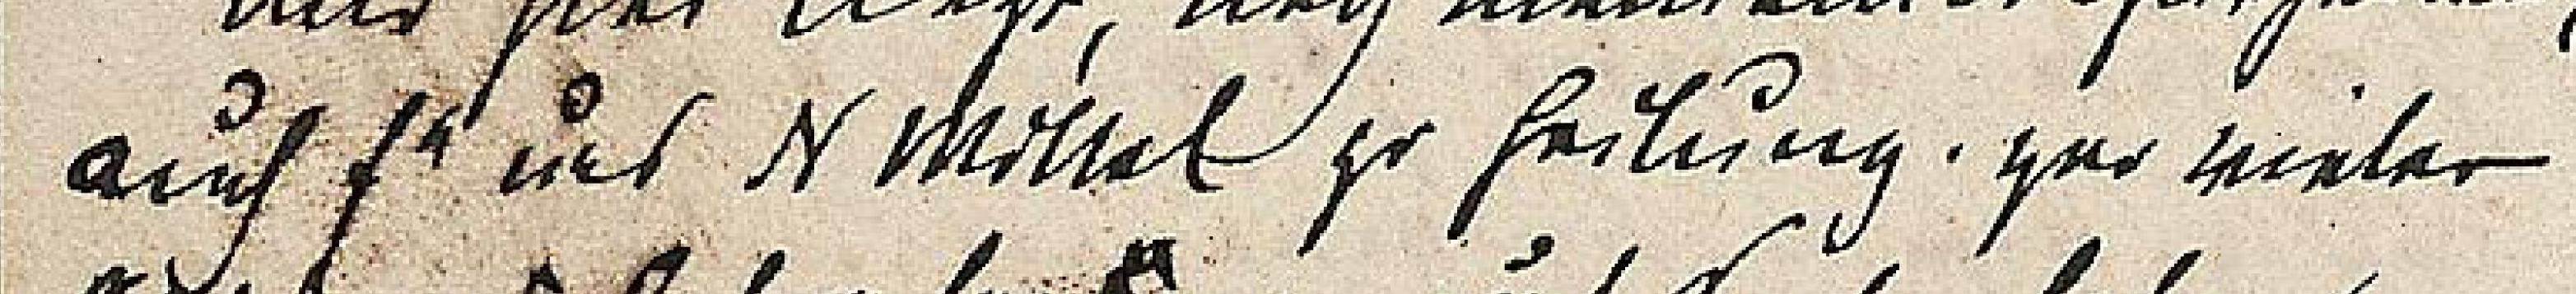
auch fü uns ds Mittel zu Heilung gar vieler
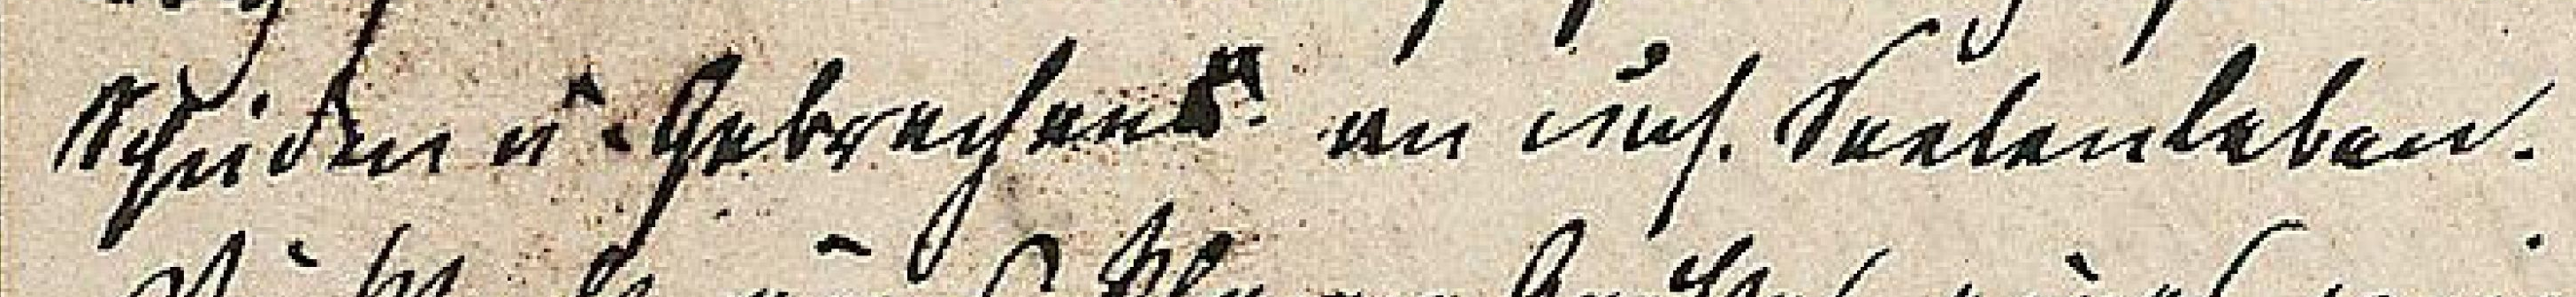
Schäden u. Gebrechen an uns. Seelenleben.
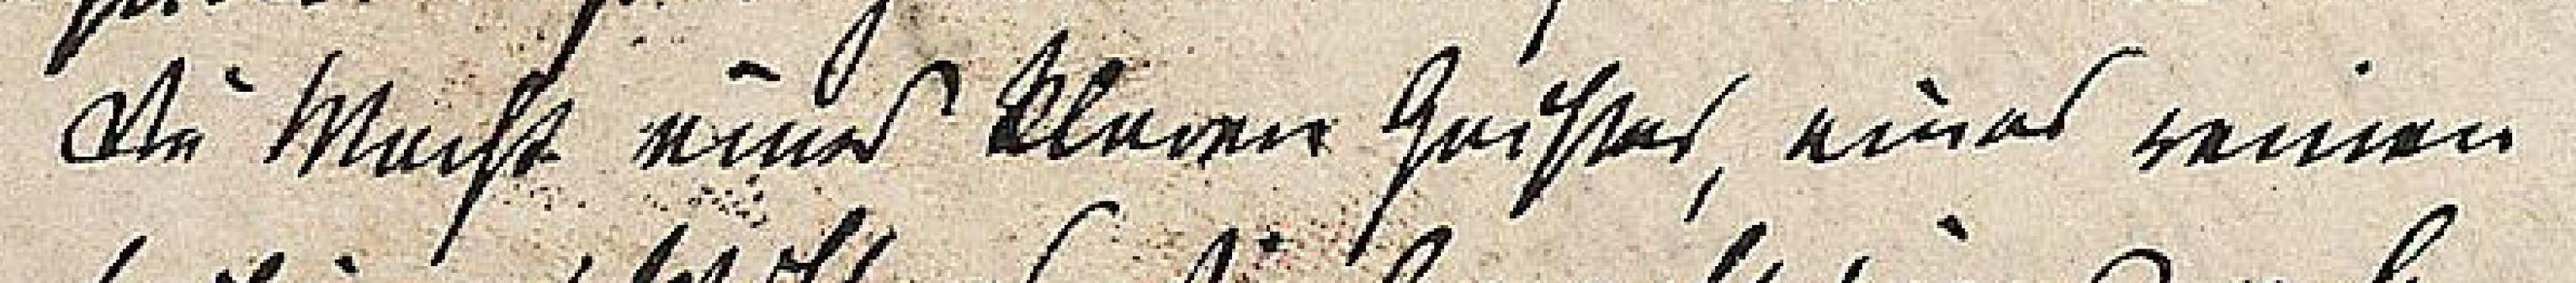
Die Macht eines klaren Geistes, eines reinen
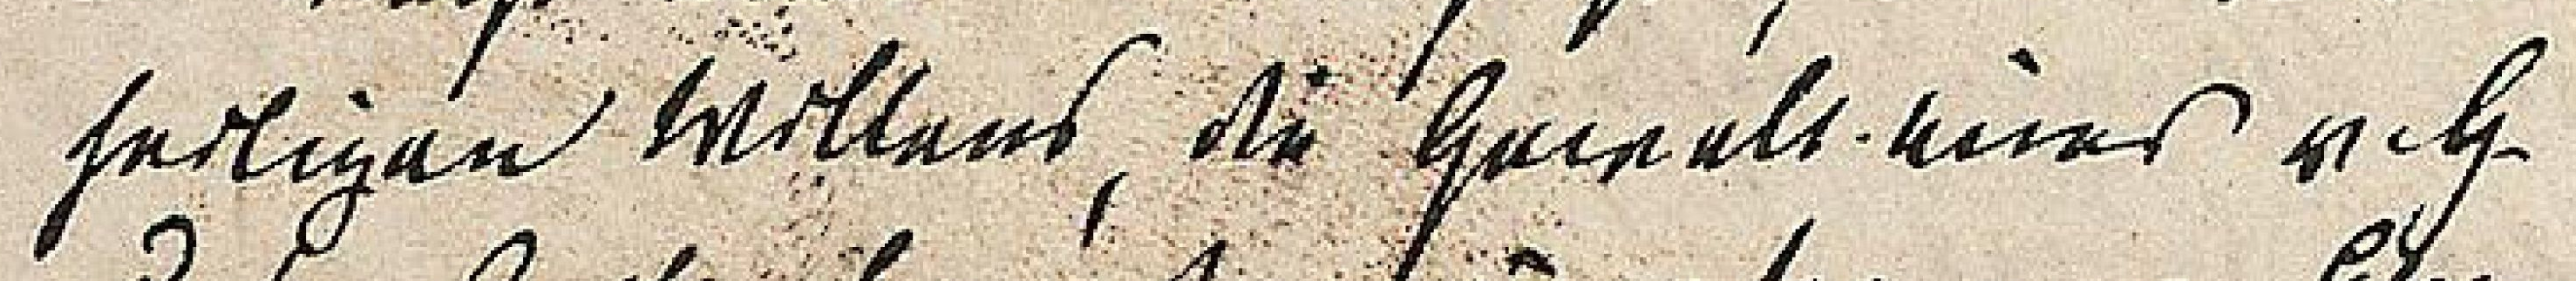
seligen Willens, die Gewalt eines relg.
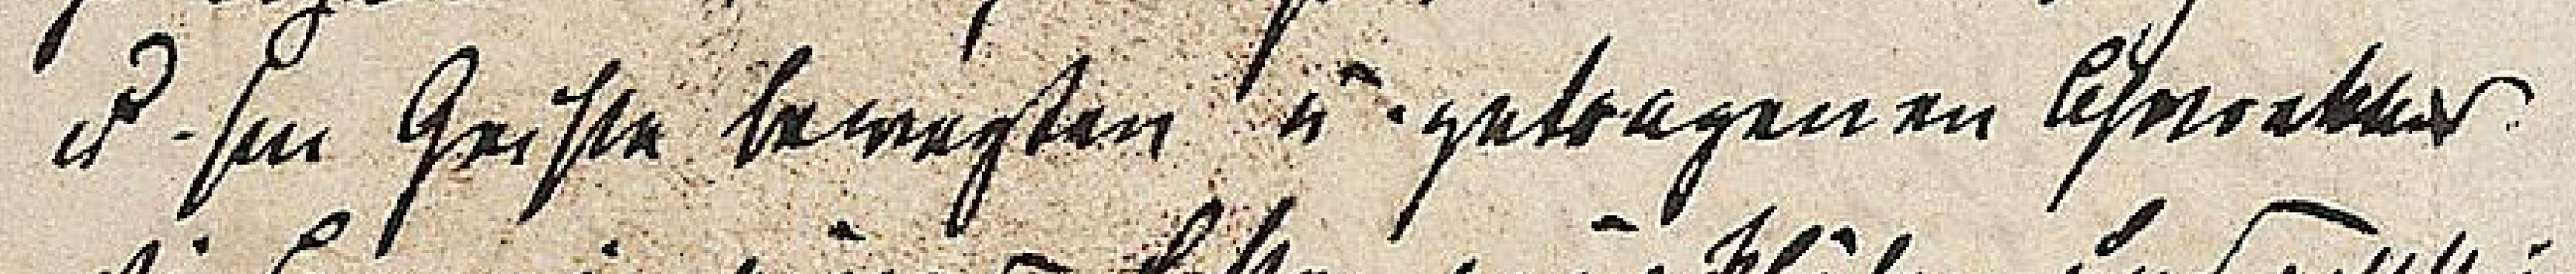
u sm Geiste bewegten u. getragenen Charakters
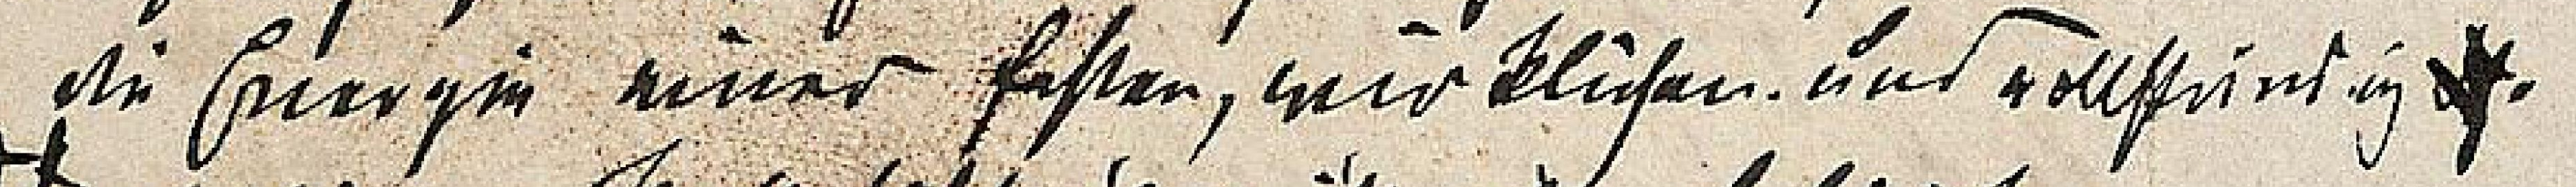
die Energie eines festen, wirklichen und vollständig ist.
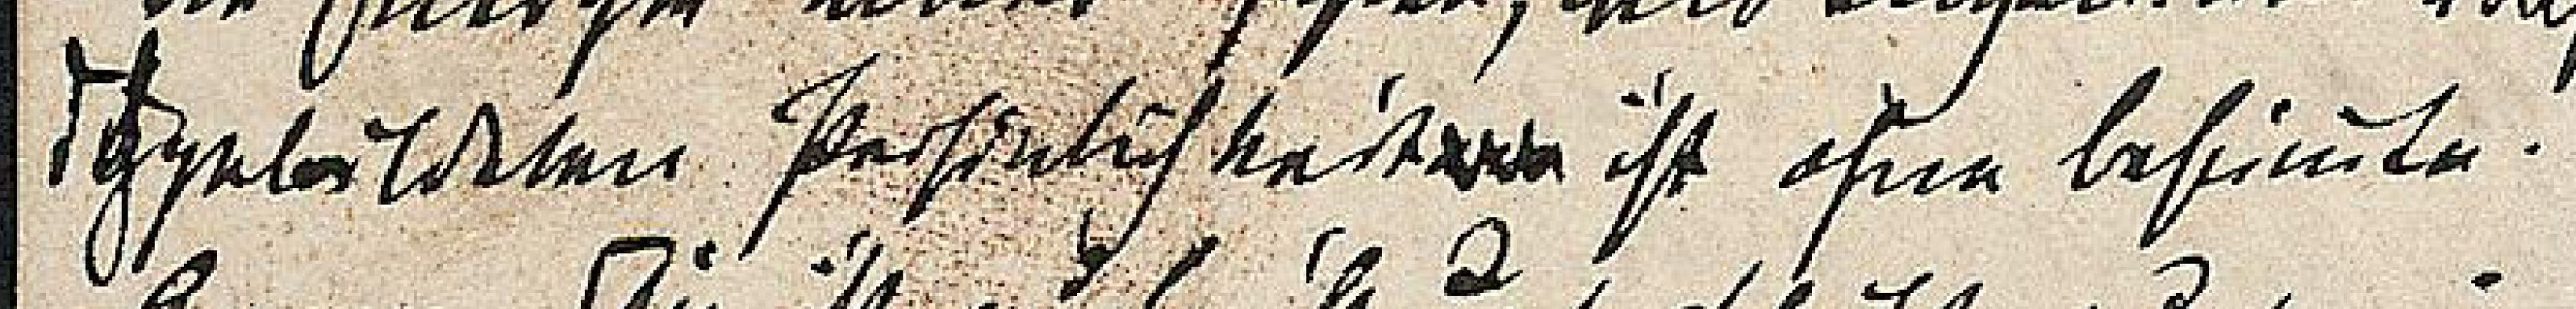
dchgebildeten Persönlichkeiten ist ohne bestimmte.
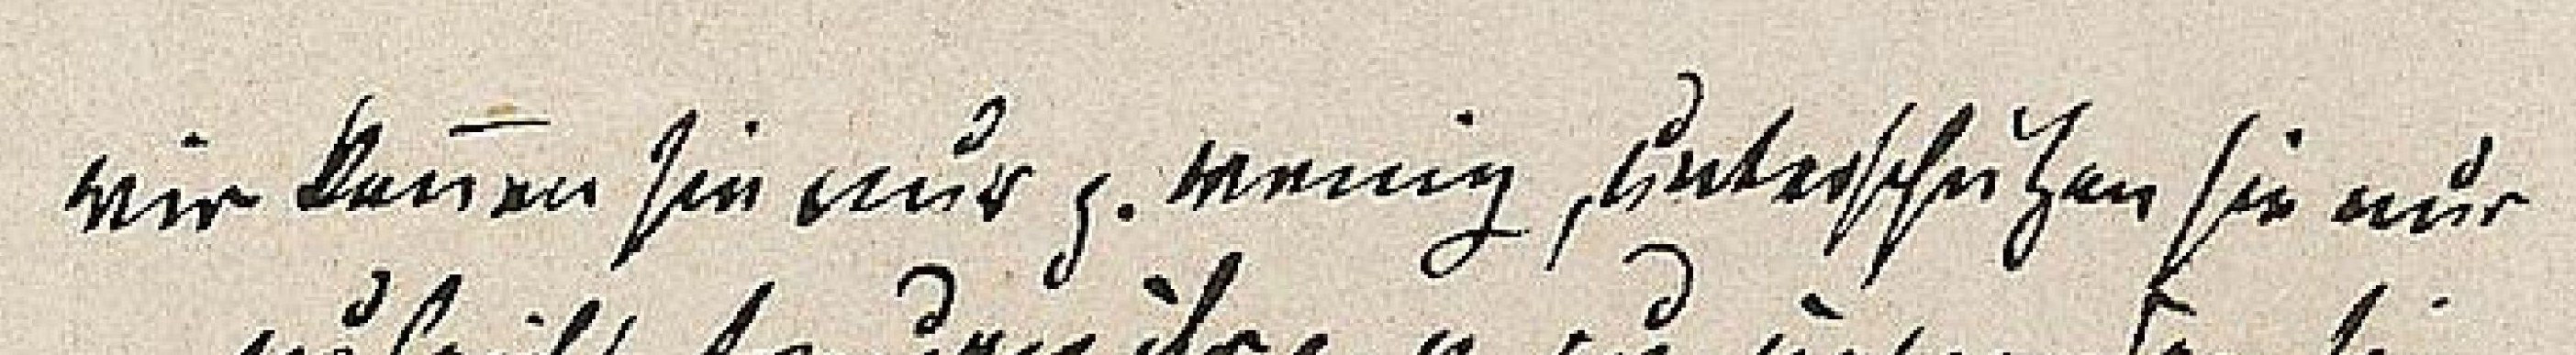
wir kenen sie nur z. wenig, unterschätzen sie nur
